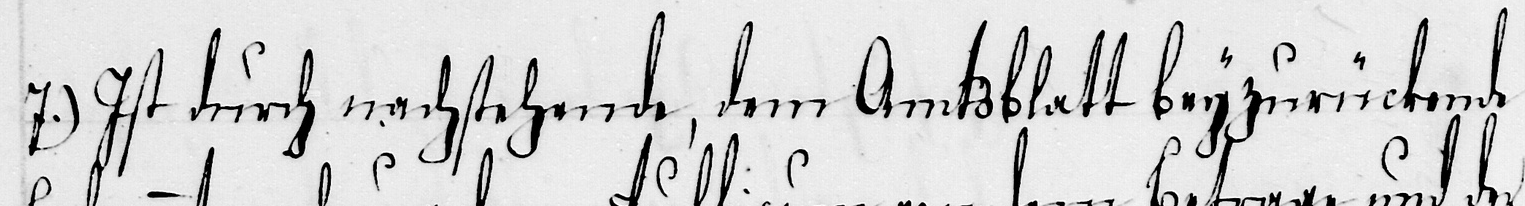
7.) Ist durch nachstehende, dem Amtsblatt beyzurückende
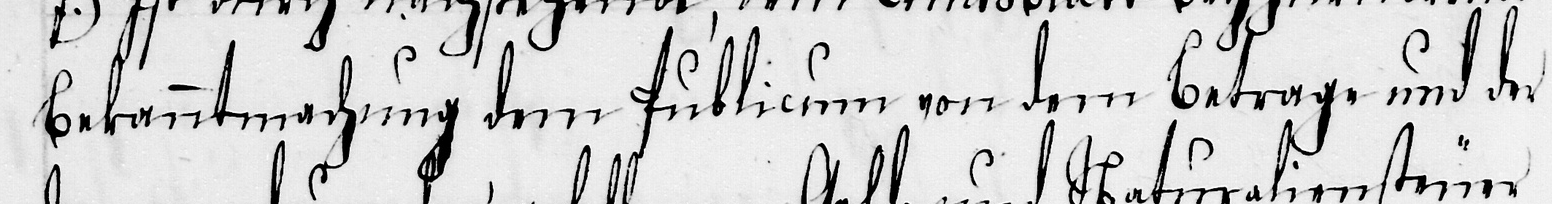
Bekanntmachung dem Publicum von dem Betrage und der
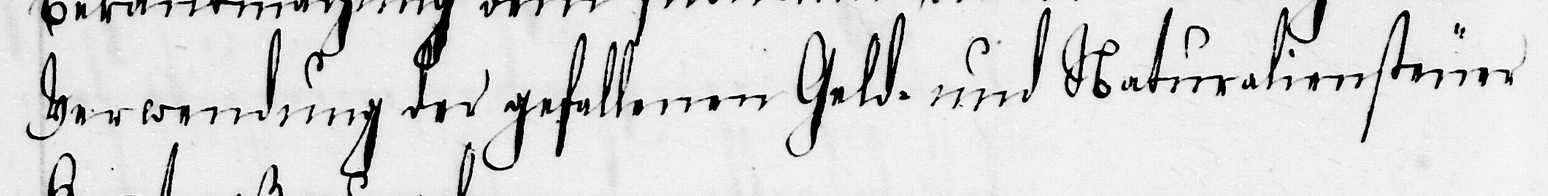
Verwendung der gefallenen Geld- und Naturaliensteuer
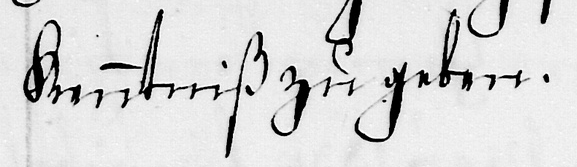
Kenntniß zu geben.
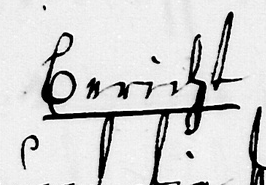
Bericht
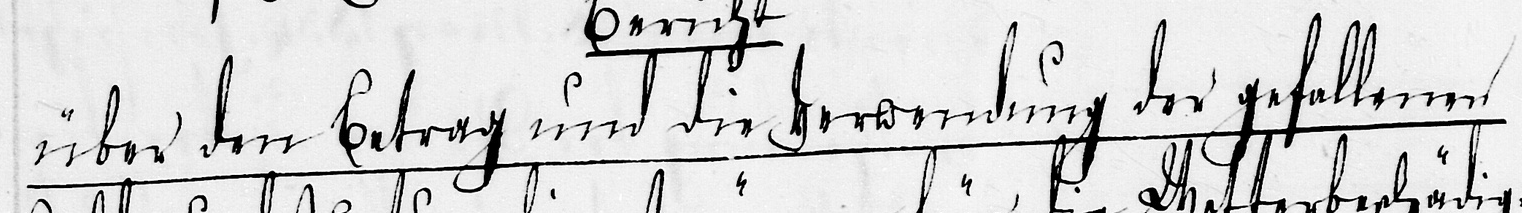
über den Betrag und die Verwendung der gefallenen
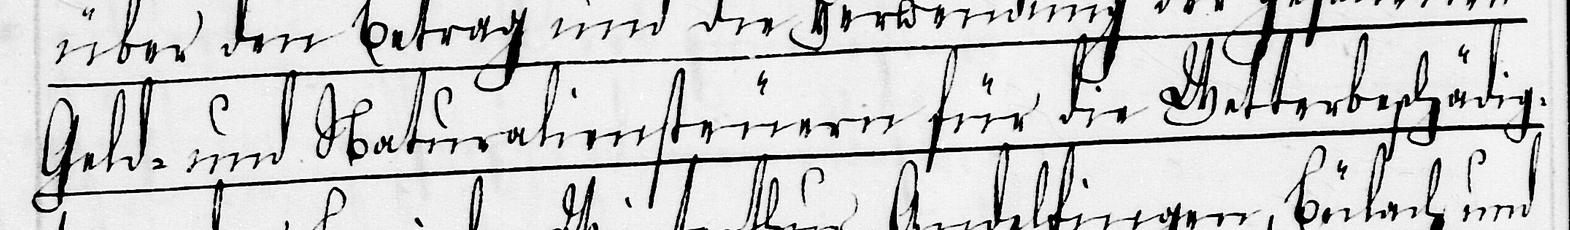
Geld- und Naturaliensteuern für die Wetterbeschädig¬
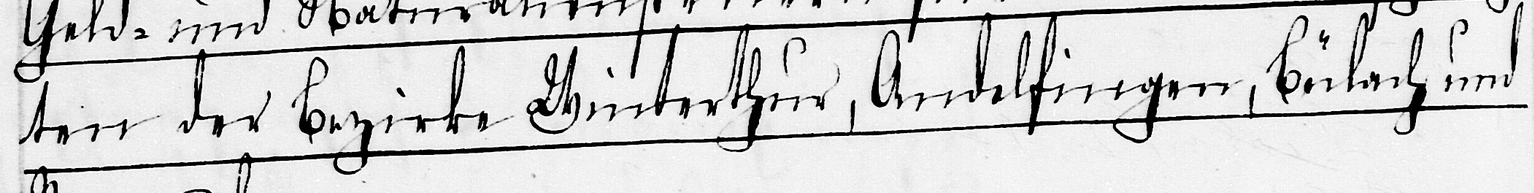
ten der Bezirke Winterthur, Andelfingen, Bülach und
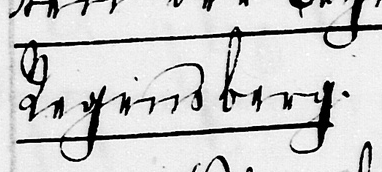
Regensberg.
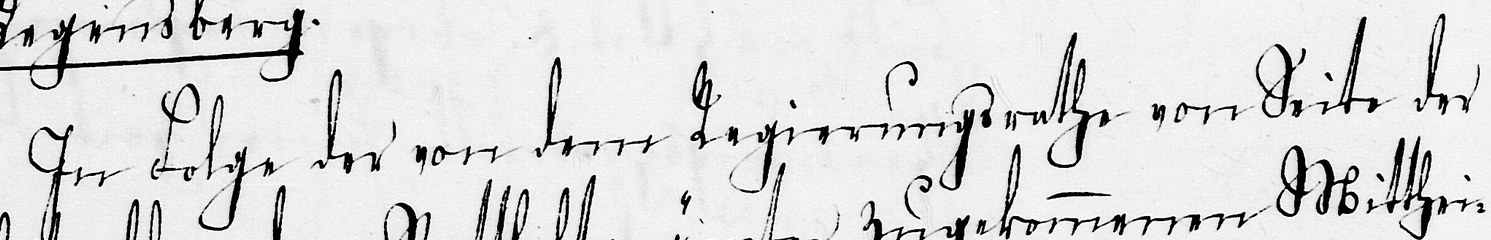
In Folge der von dem Regierungsrathe von Seite der
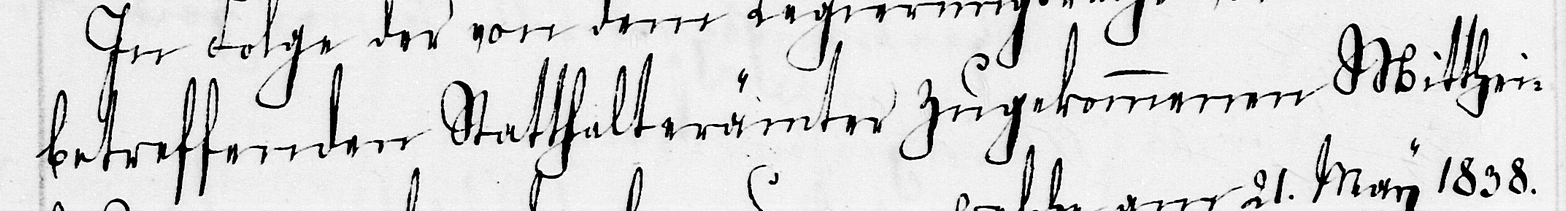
betreffenden Statthalterämter zugekommenen Mitthei¬
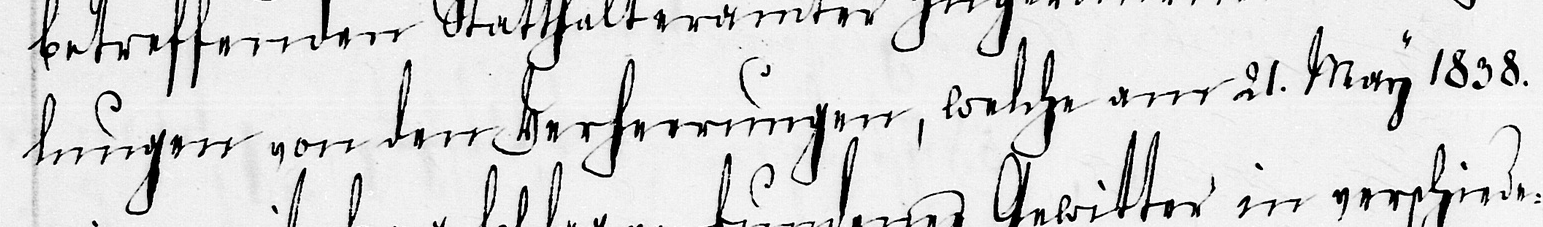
lungen von den Verheerungen, welche am 21. März 1838.
